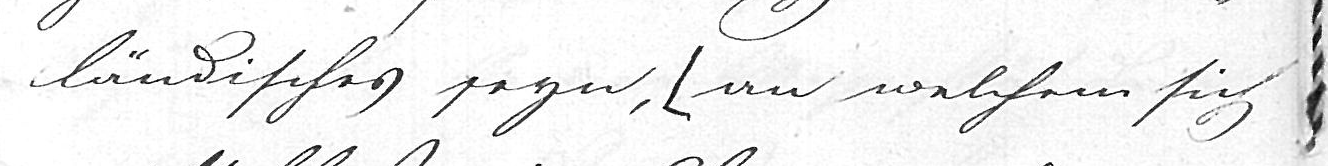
ländisches seyn, an welchem sich
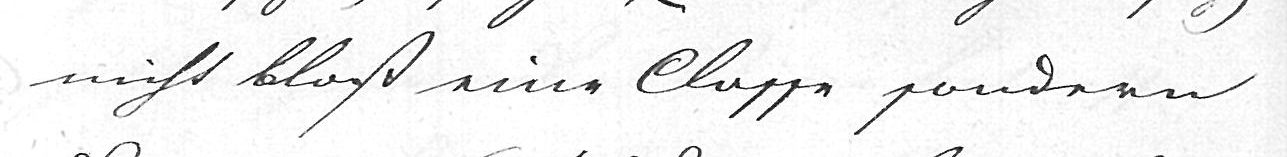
nicht bloß eine Classe sondern
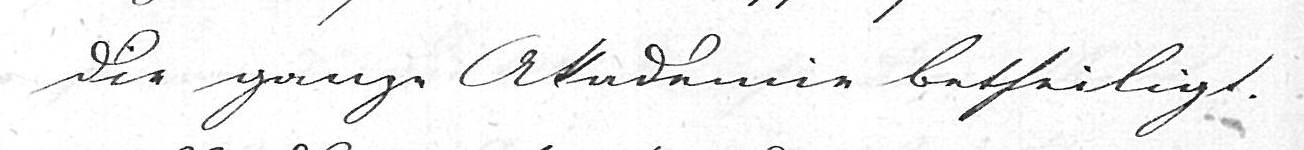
die ganze Akademie betheiligt.
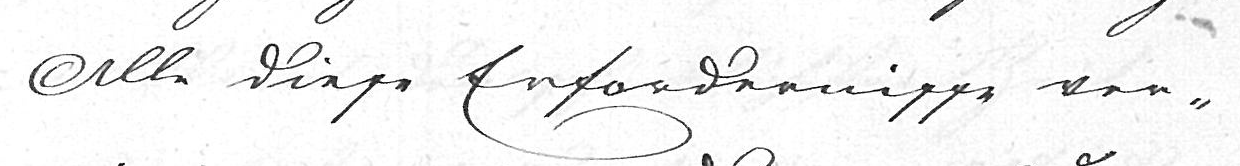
Alle diese Erfordernisse ver-
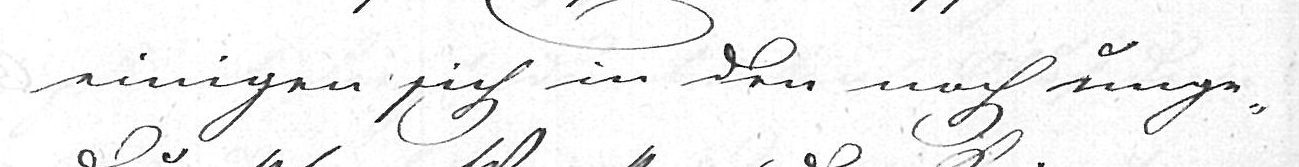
einigen sich in den noch unge-
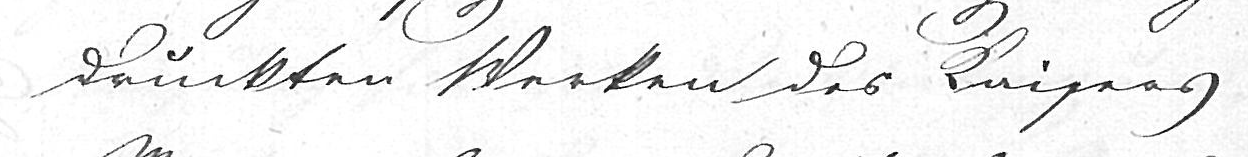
druckten Werken des Kaisers
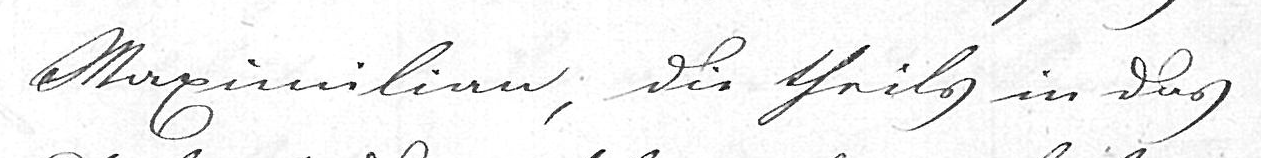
Maximilian, die theils in das
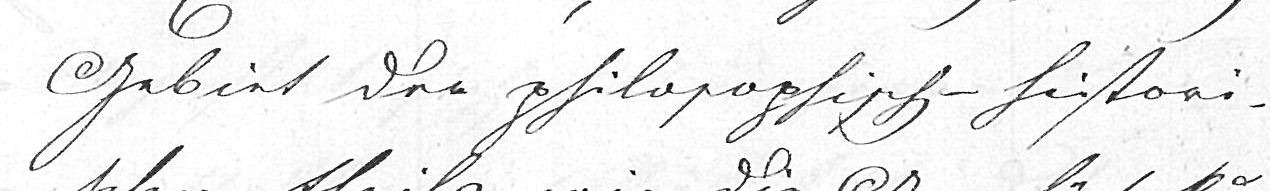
Gebiet der philosophisch-histori-
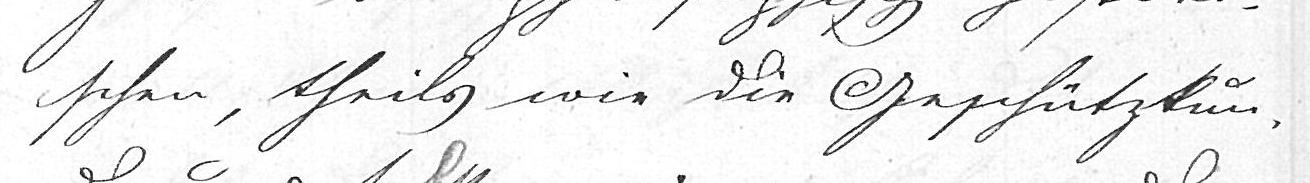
schen, theils wie die Geschützkun-
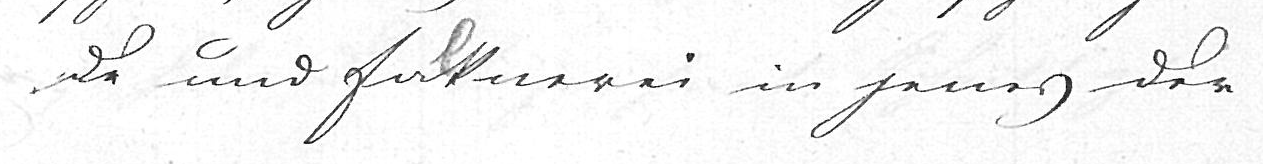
de und Falknerei in jene der
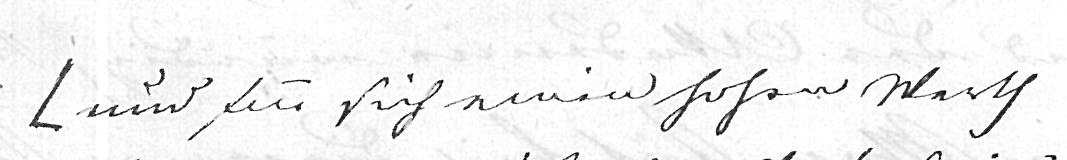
und für sich einen hohen Werth
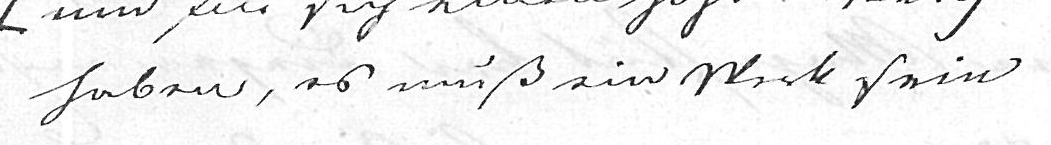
haben, es muß ein Werk sein
